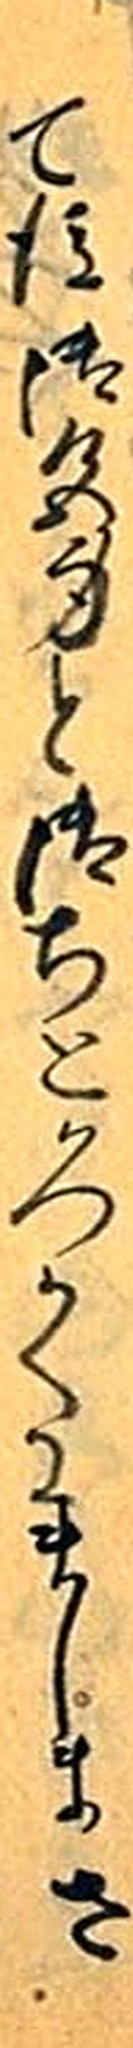て後御色身と御ちとかつかくにましまさ
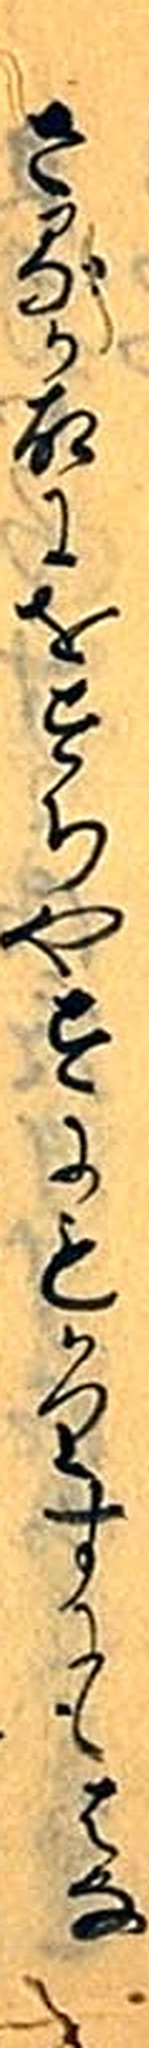さるか故にをすちやすにもかりすにもはな
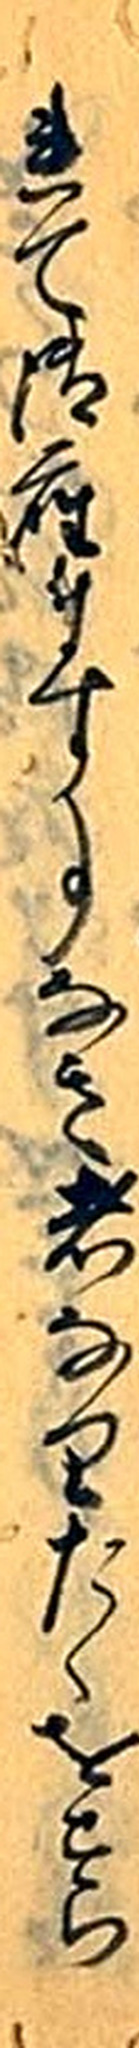れて御座ます事なき者なりたゝをすち
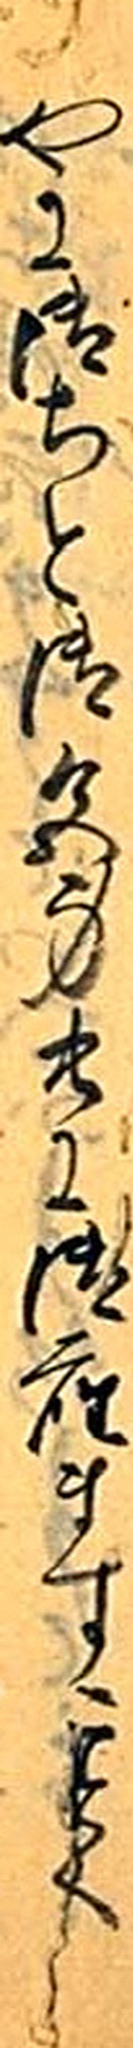やに御ちと御色身共に御座ますことく
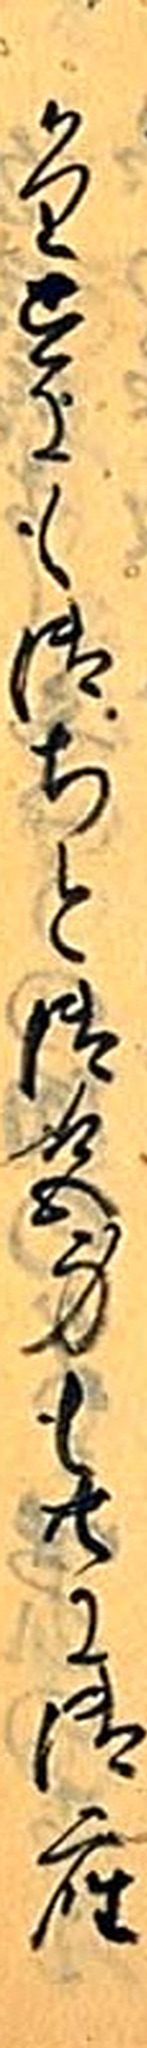かりすにも御ちと御色身も共に御座
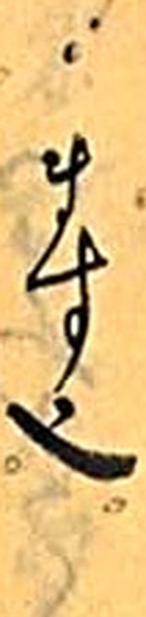ます也
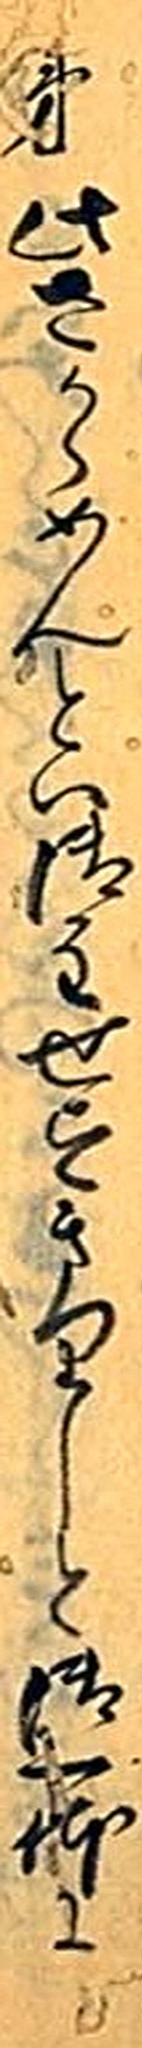弟此さからめんとは御主せすきりしと御一体に
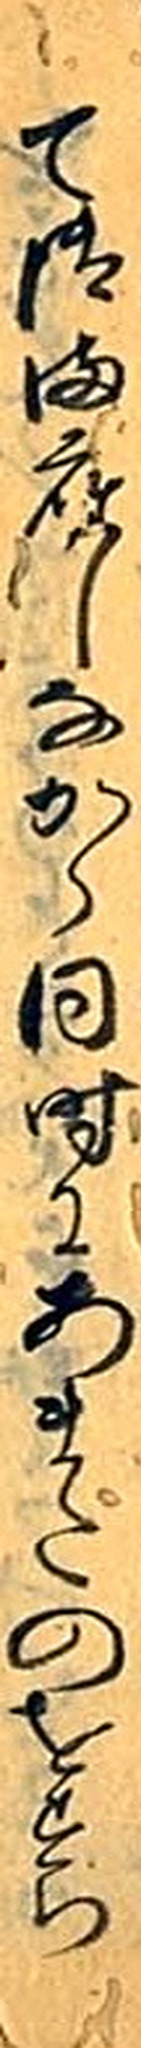て御ま座しなから同時にあまたのをすち
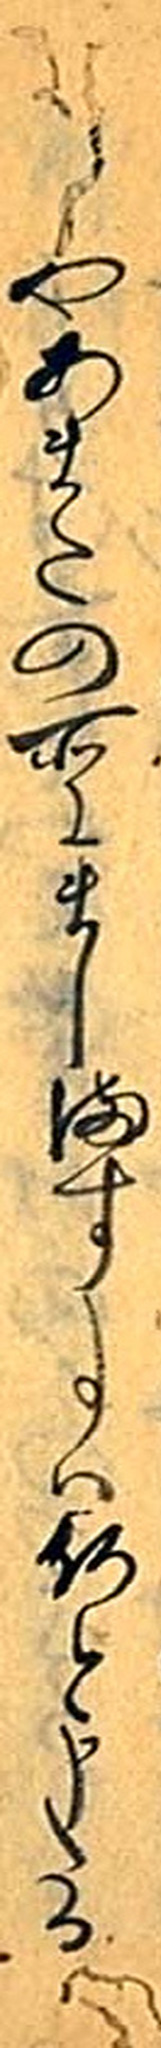やあまたの所にまします事は何と申たる
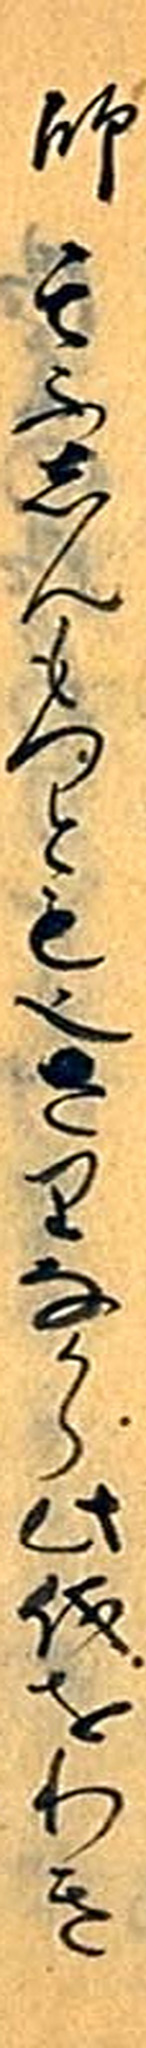師其ふしんもつとも也さりなから此儀をわき
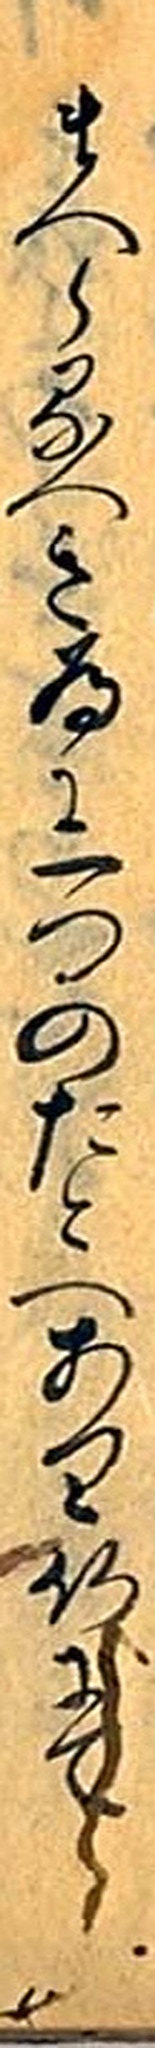まへらるへき為に一つのたとへあり何にて
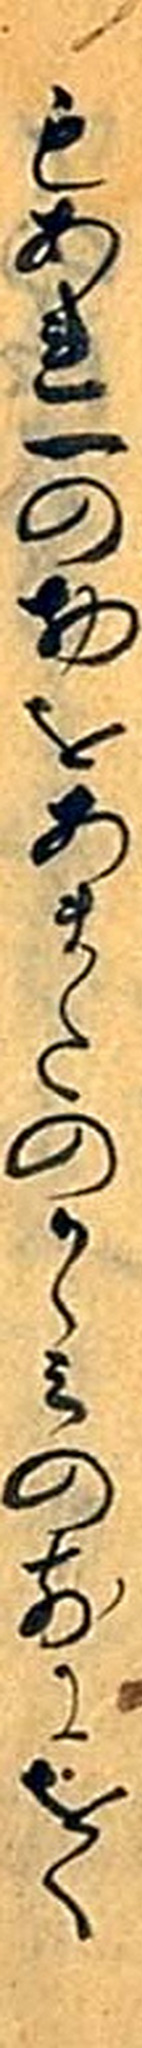もあれ一の物をあまたのかゝみの前にをく
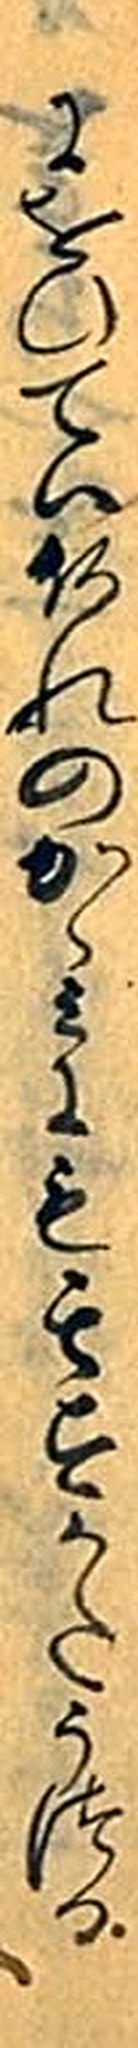にをひては何れのかゝみも其すかたうつる
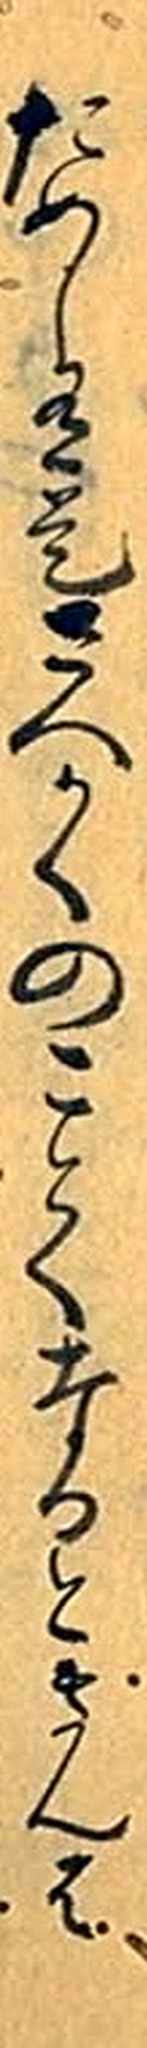ためし有是さへかくのことくなるときんは
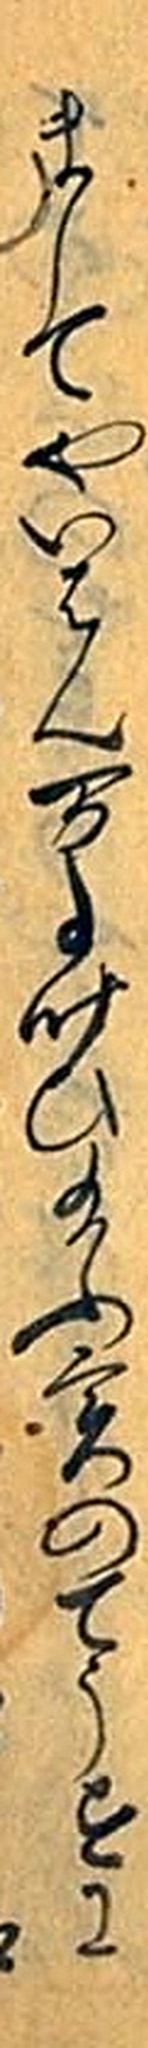ましてやいはん万事叶ひ給ふ実のてうすに
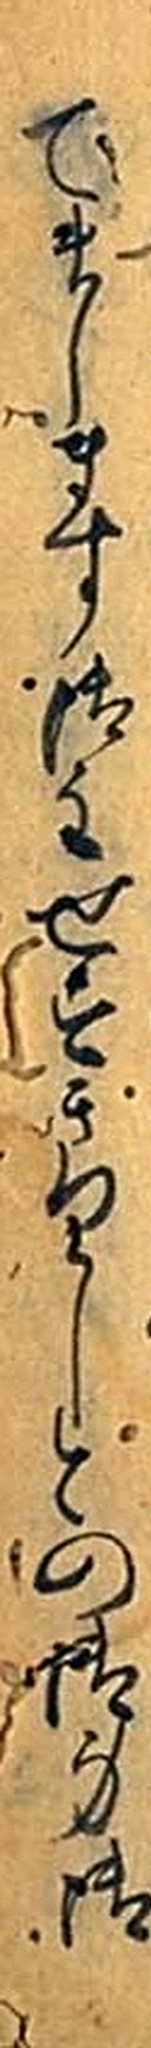てまします御主せすきりしとの御身御
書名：ドチリナ・キリシタン
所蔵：東京大学総合図書館 / General Library in the University of Tokyo
